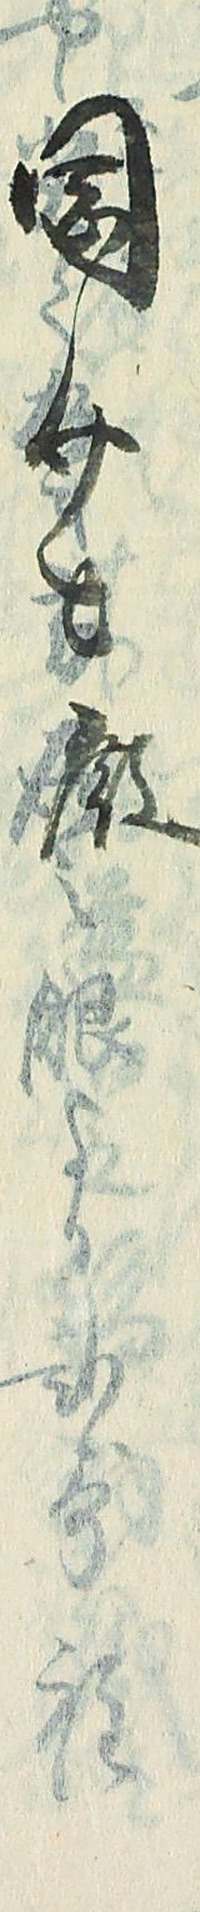岡介七殿
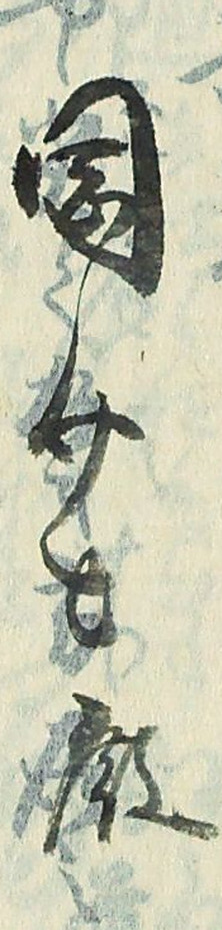岡介七殿
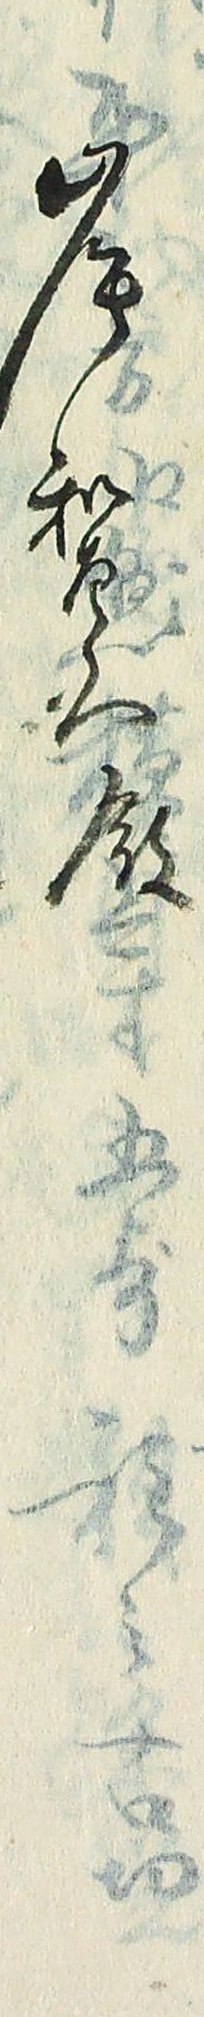岸和左衛門殿
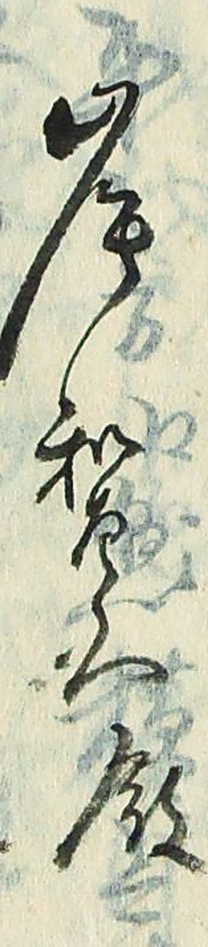岸和左衛門殿
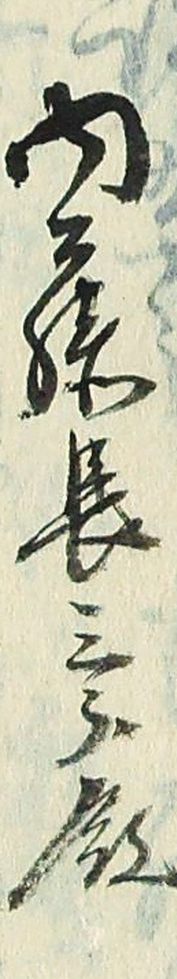内藤長三郎殿
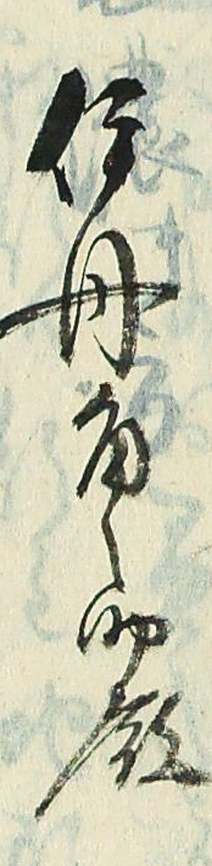伊丹角之助殿
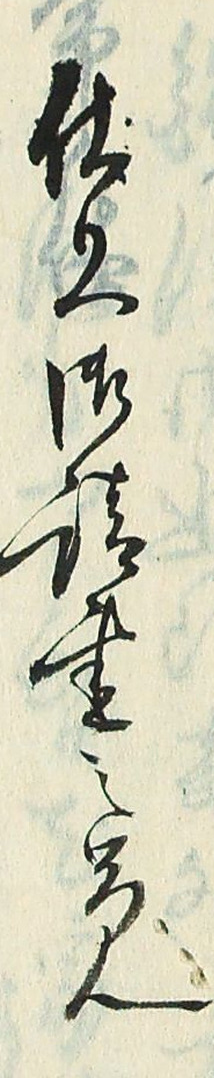仕上御請書之覚
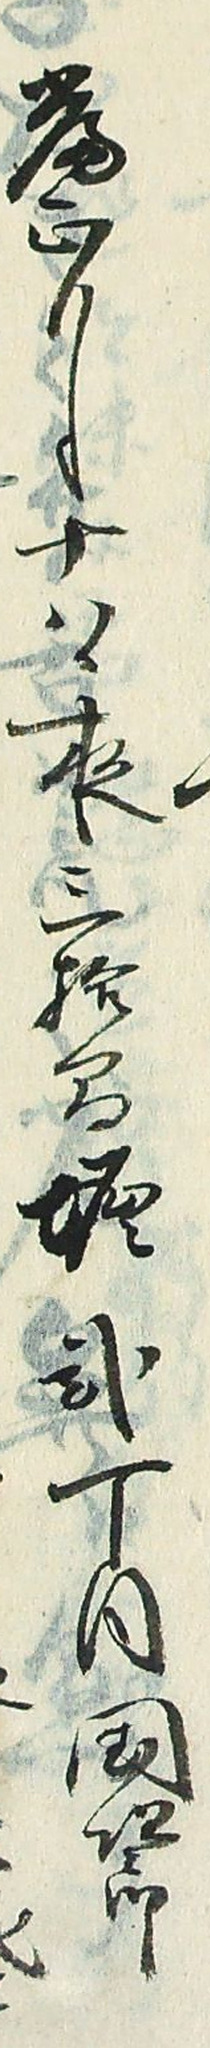当正月十八日夜三拾間掘弐丁目国次郎
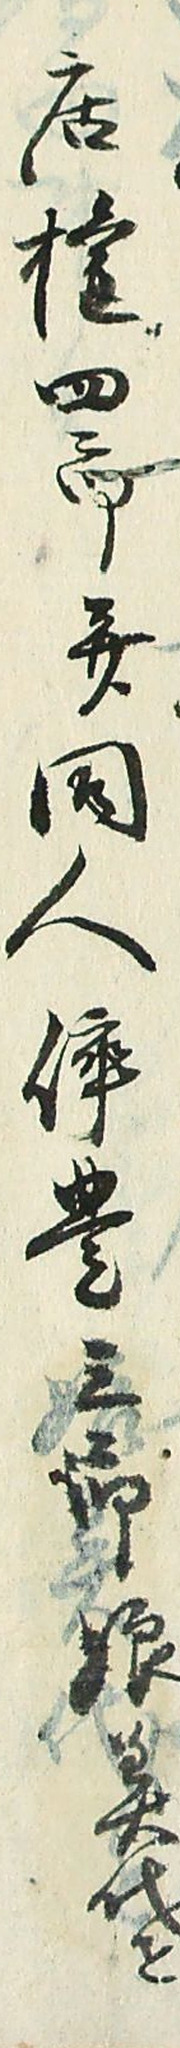店権四郎幷同人倅豊三郎娘美代を

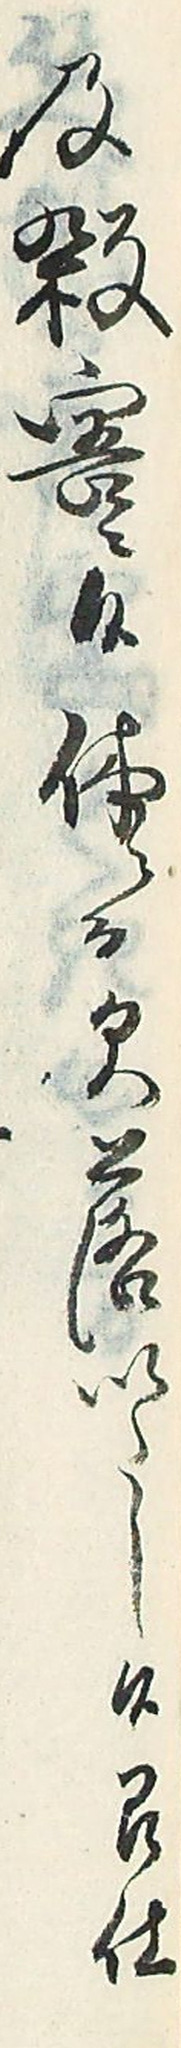及殺害に候体にて欠落いたし候即召仕
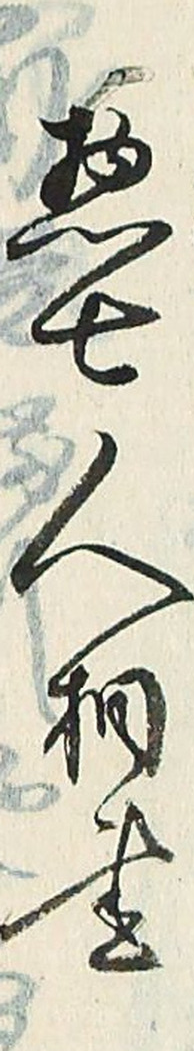惣七人相書
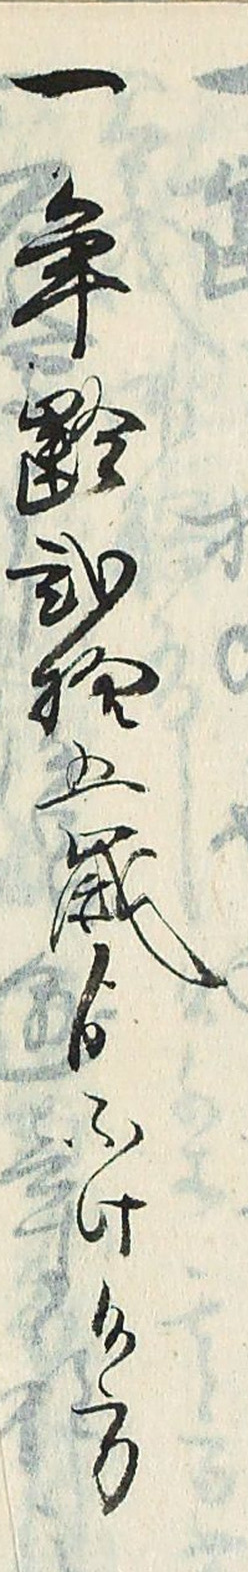一年齢弐拾五歳ゟふけ候方
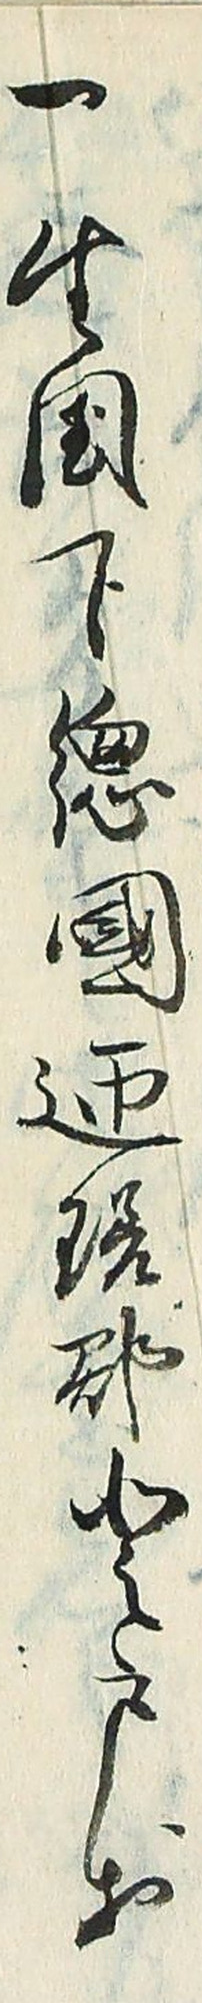一生国下総迊瑳郡登戸村
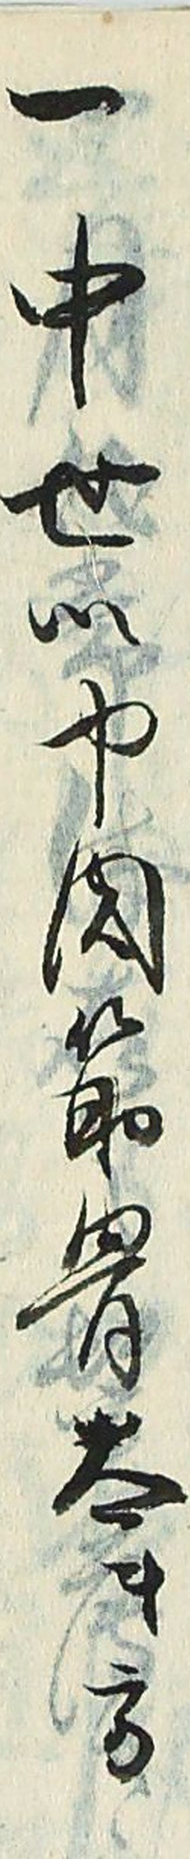一中せい中肉筋骨太き方
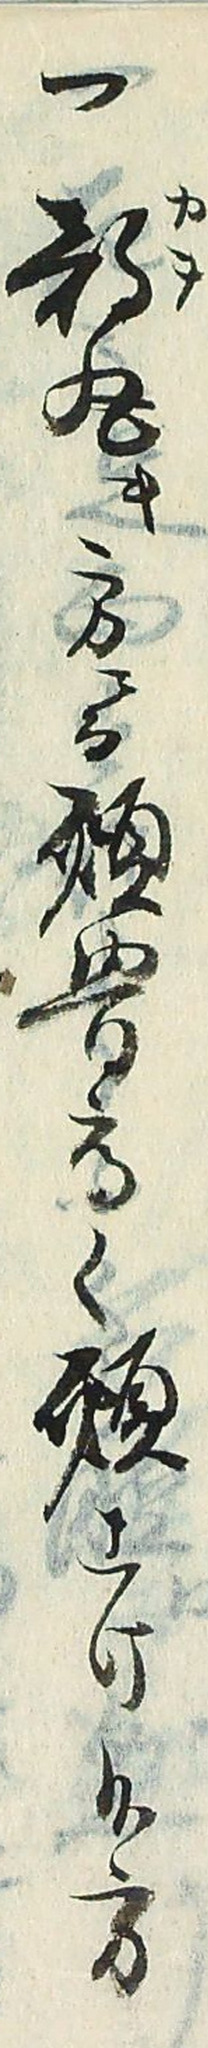一顔丸キ方にて頬骨高く頬こけ候方
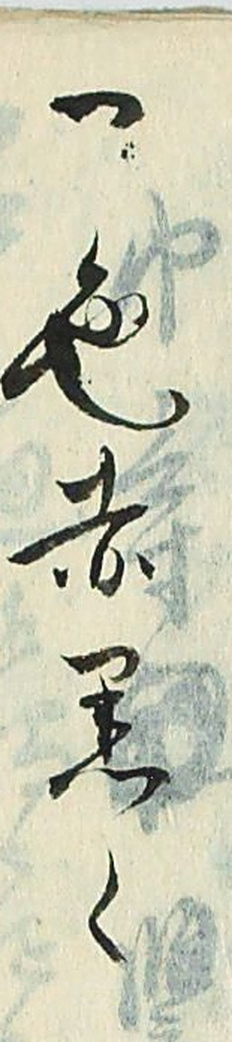一色赤黒く
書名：諸御用御□受書控
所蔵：鳴門教育大学 Naruto University of Education
